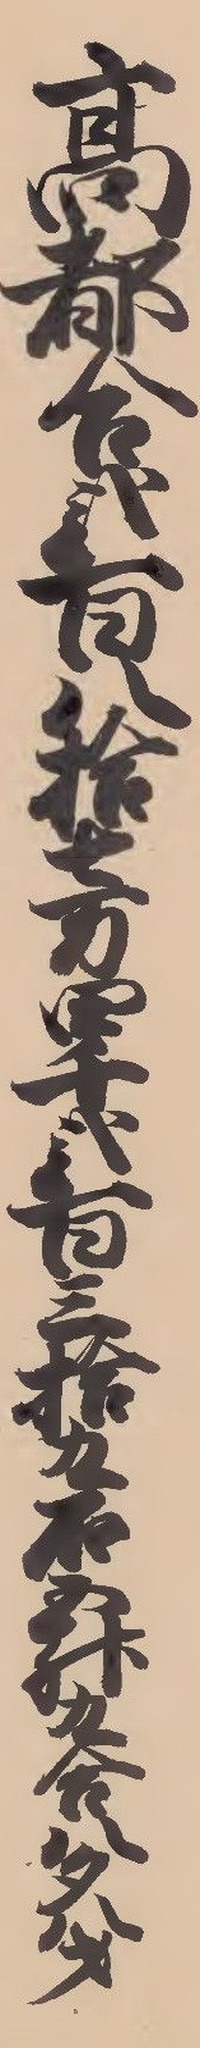高都合弐百八拾七万四千弐百三拾九石五升九合八勺八才
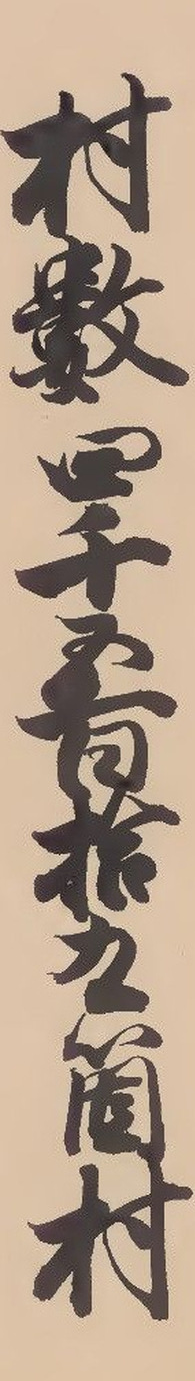村数四千五百拾九箇村

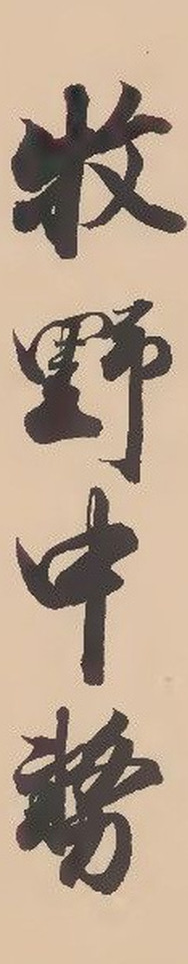牧野中務
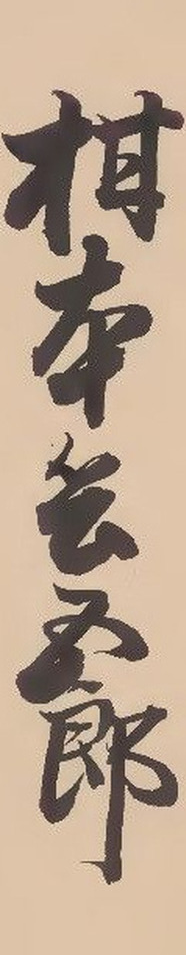柑本兵五郎
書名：陸奥国郷帳　７
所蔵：国立公文書館 National Archives of Japan
